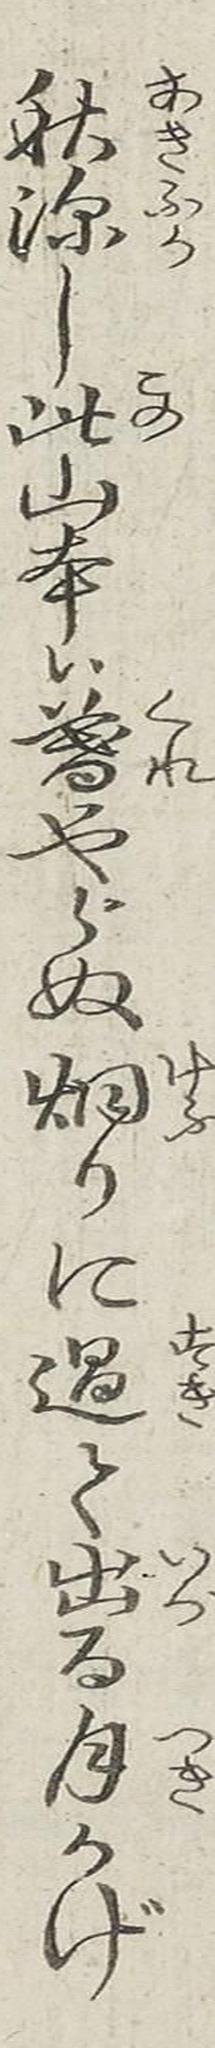秋深し此山幸い暮やらぬ烟りに過て出る月かげ
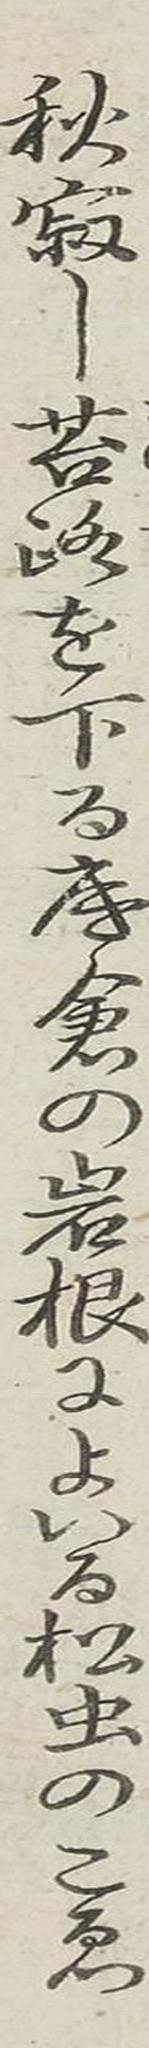秋寂し苔路を下る底倉の岩根によいる松虫のこゑ
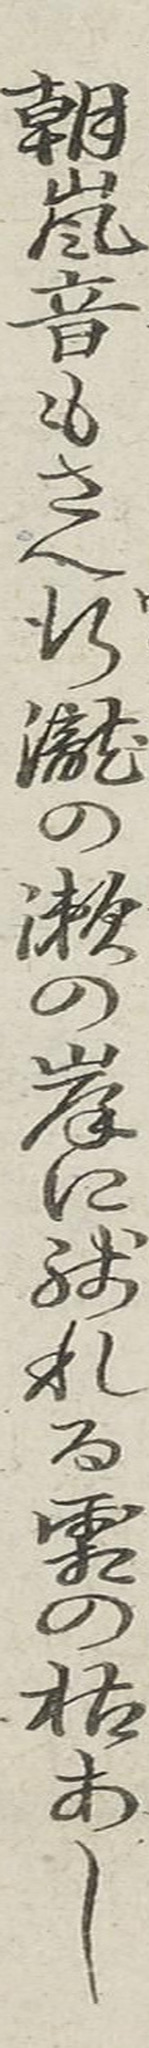朝嵐音もさへ行瀧の瀬の岸に残れる霜の枯あし
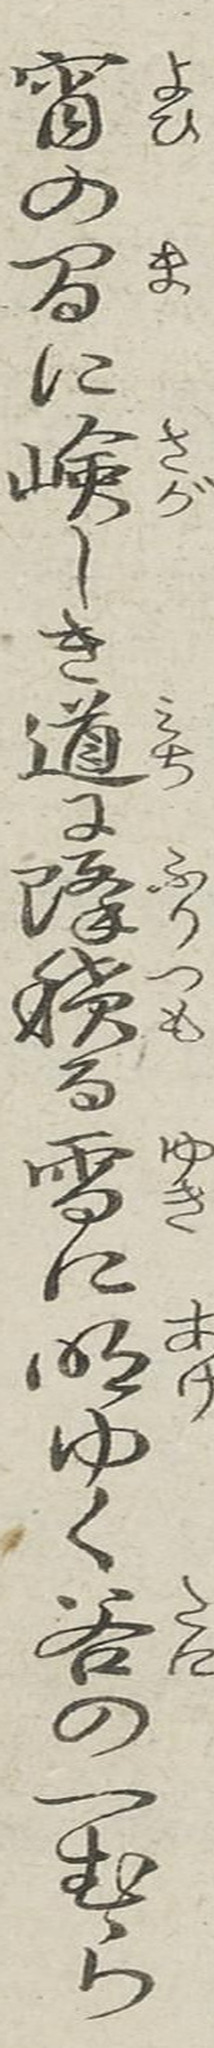宵の間に嶮しき道に降積る雪に明ゆく谷の一むら

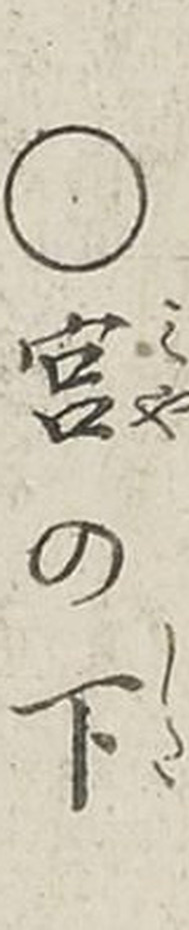○宮の下
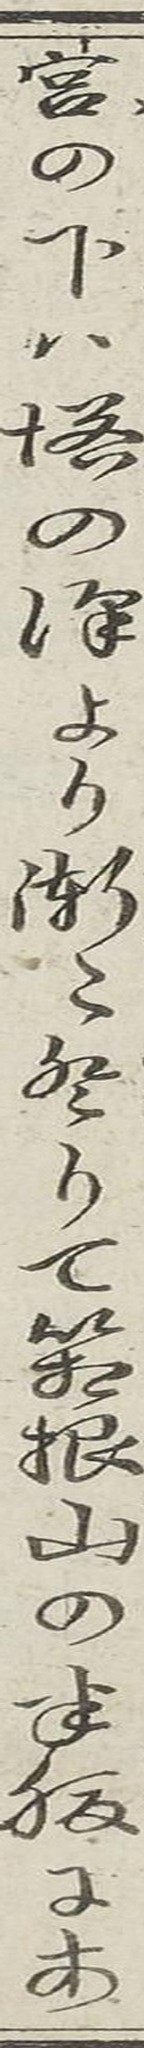宮の下は塔の澤より漸〻登りて箱根山の半腹にあ
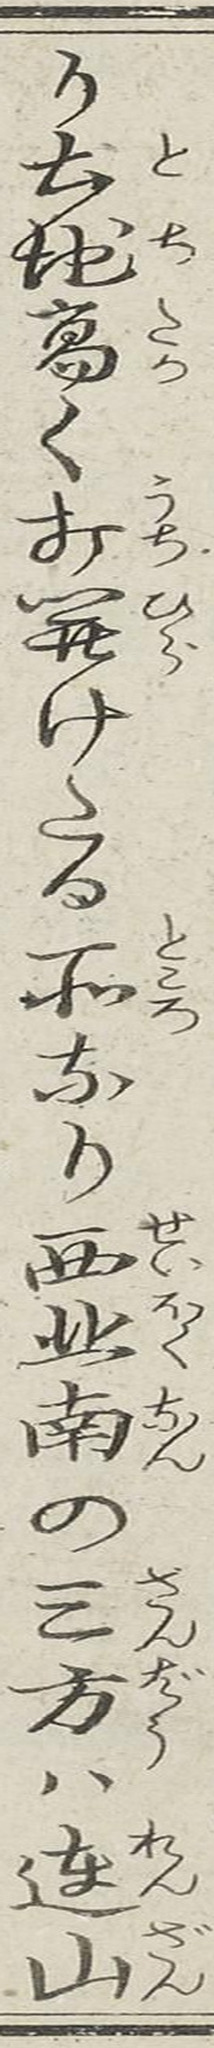り土地高く打開けたる所なり西北南の三方は連山
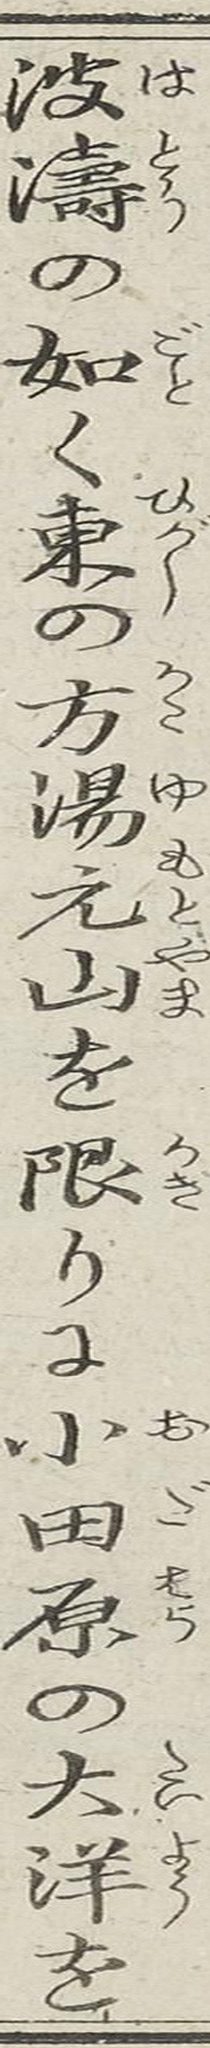波濤の如く東の方湯元山を限りに小田原の大洋を
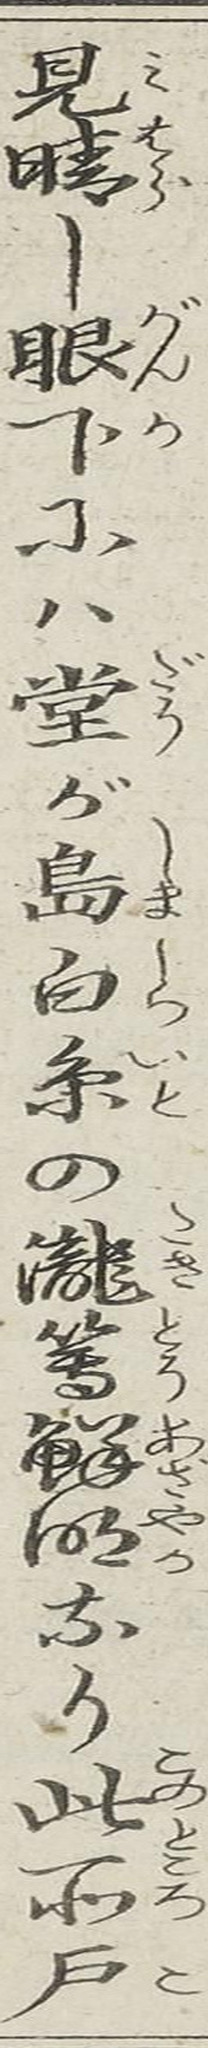見晴し眼下には堂が島白糸の瀧等鮮明なり此所戸
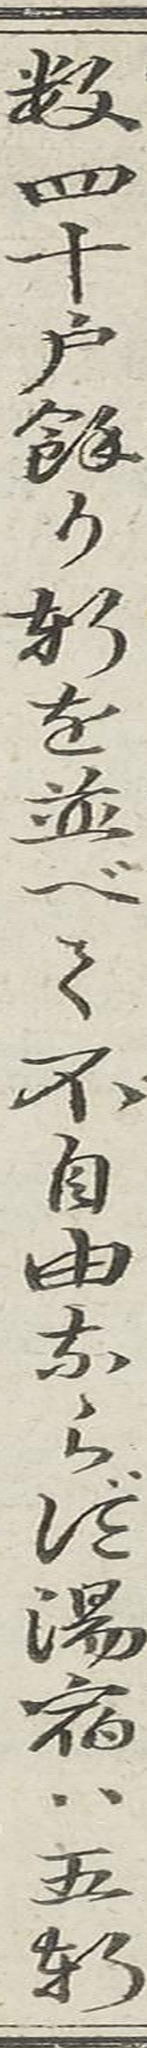数四十戸餘り軒を並べて不自由ならず湯宿は五軒
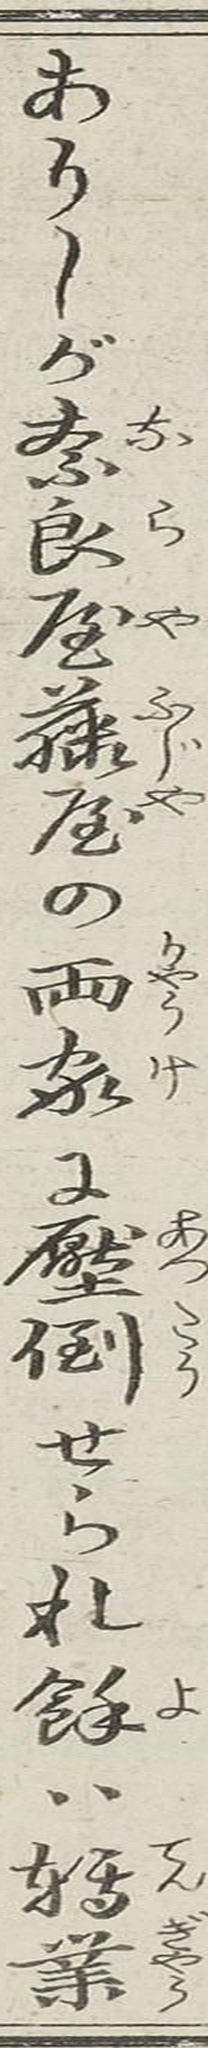ありしが奈良屋藤屋の両家に圧倒せられ餘は転業
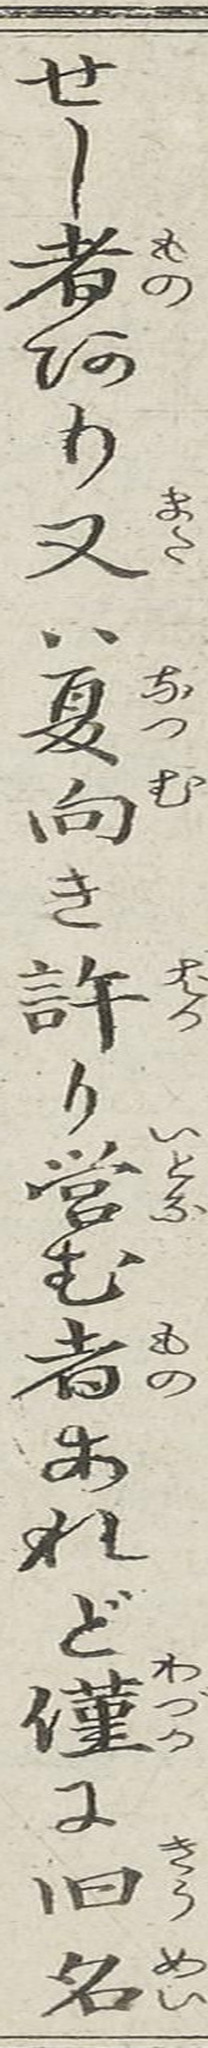せし者あり又は夏向き許り営む者あれど僅に旧名
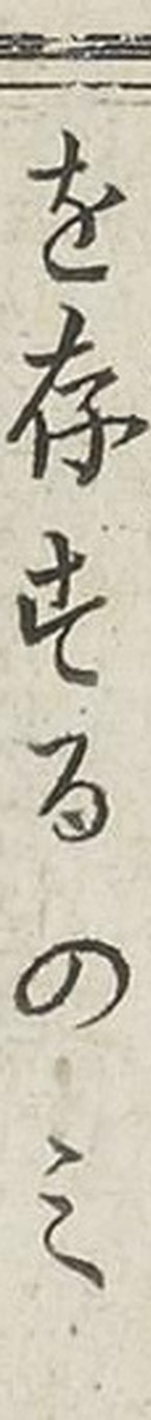を存するのみ
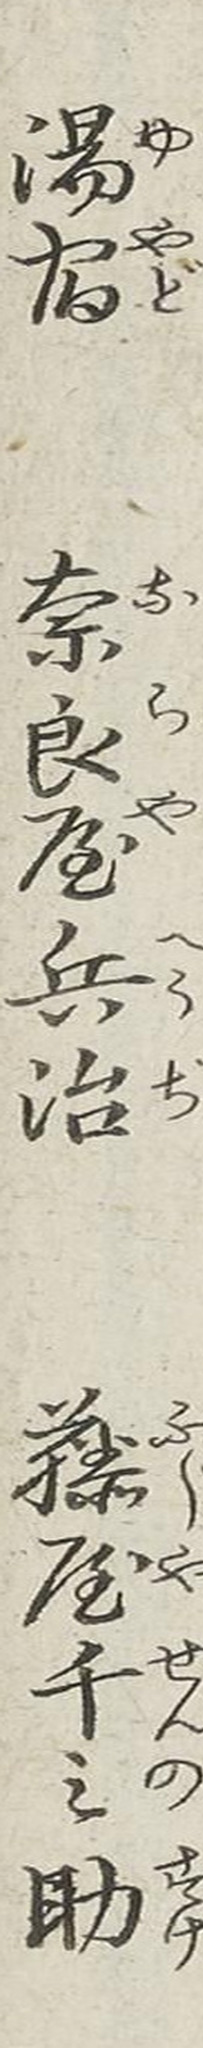湯宿奈良屋兵治藤屋千之助
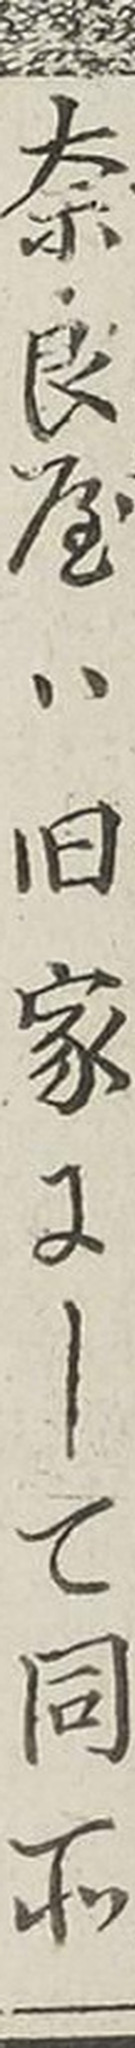奈良屋は旧家にして同所
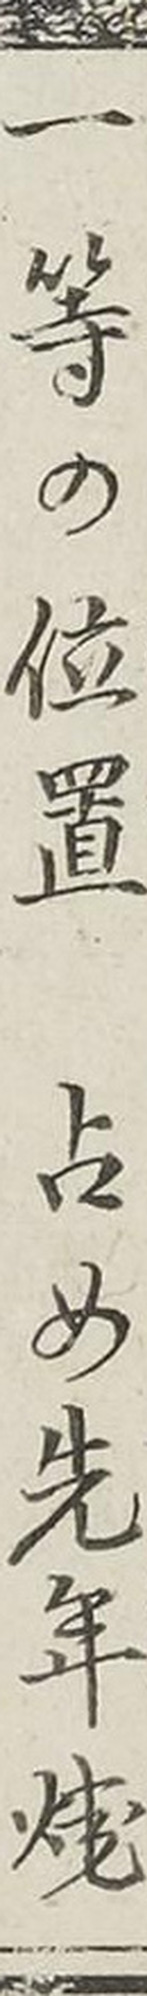一等の位置占め先年焼
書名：箱根温泉誌　全
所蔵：東京大学地震研究所図書室 Earthquake Research Institute Library, The University of Tokyo, JAPAN
